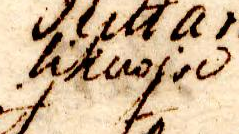likewise
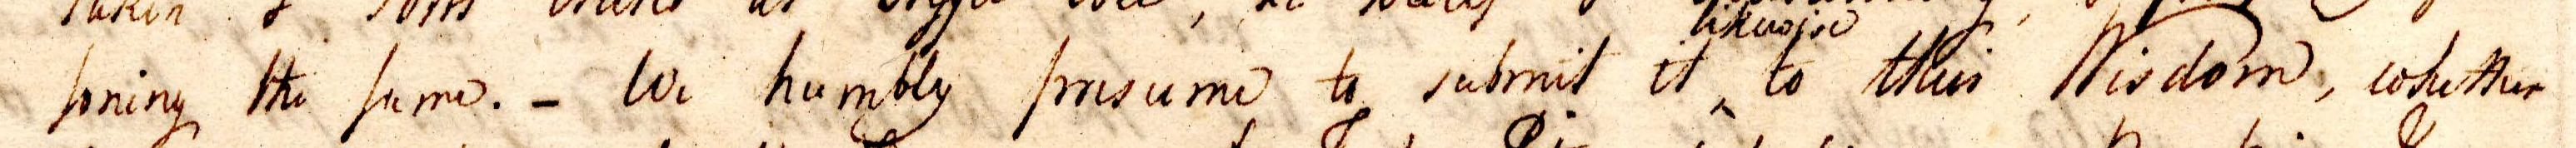soning the same.- We humbly presume to submit it ^ to their Wisdom, whether
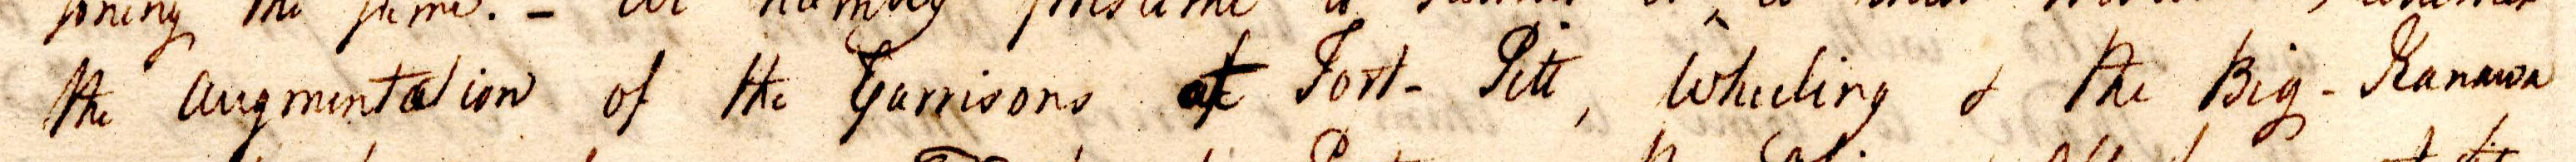the augmentation of the Garrisons at Fort. Pitt, Wheeling & the Big Kanawa
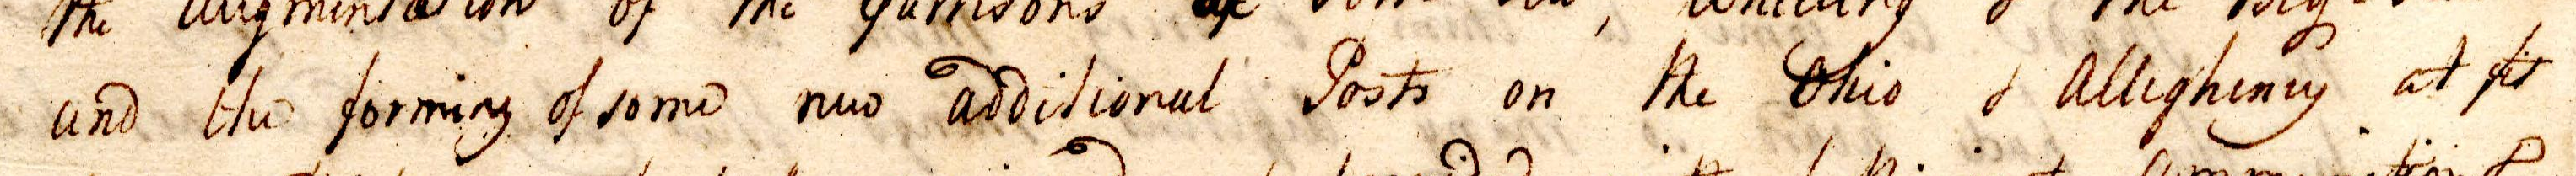and the forming of some new additional Posts on the Ohio & Allegheny at its
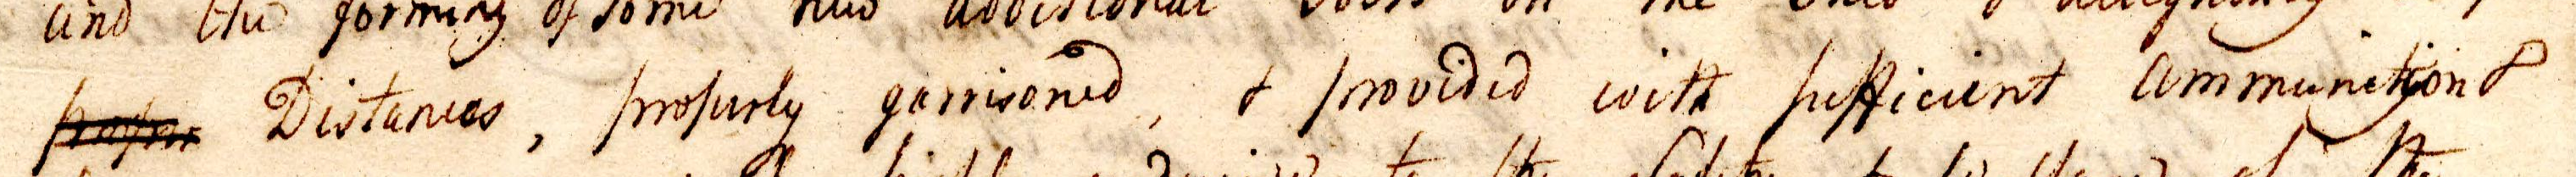[proper] Distances, properly garrisoned, & provided with sufficient ammunition &
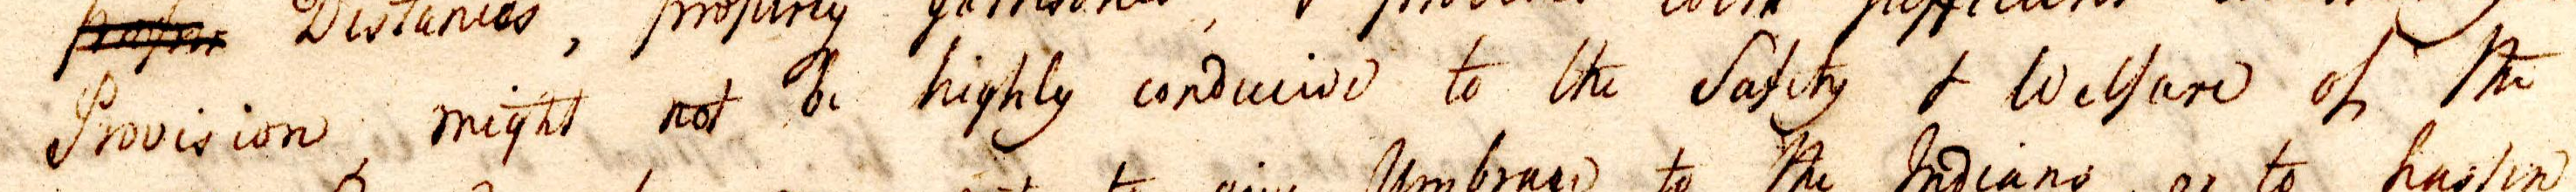Provision, might not be highly conducive to the Safety & Welfare of the
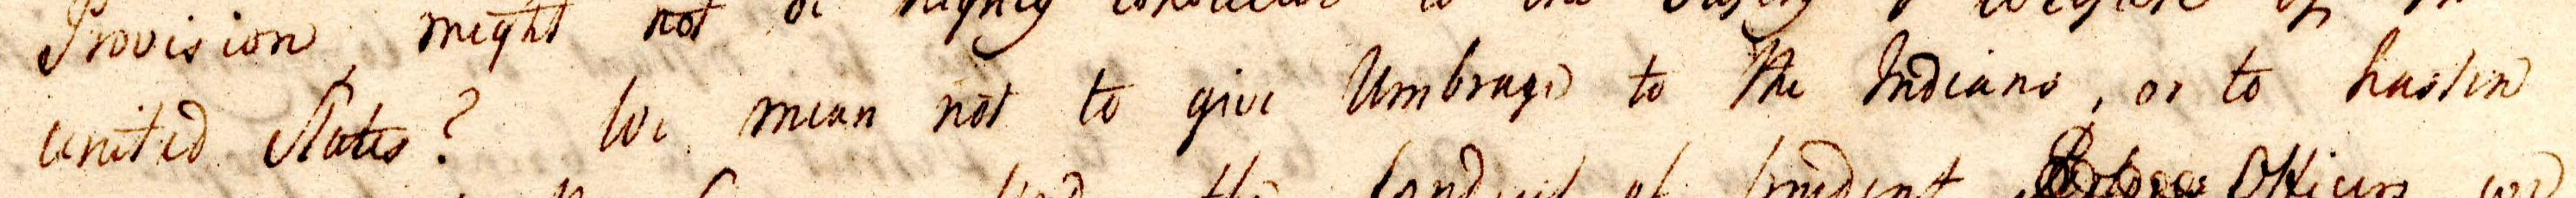united States? We mean not to give umbrage to the Indians, or to hasten
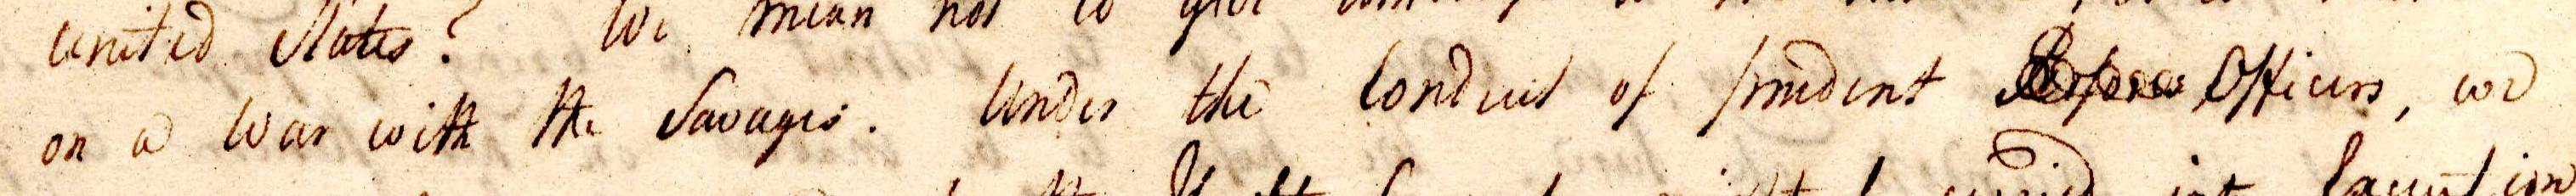on a War with the Savages. Under the Conduct of Incident [Persons] Officers, we
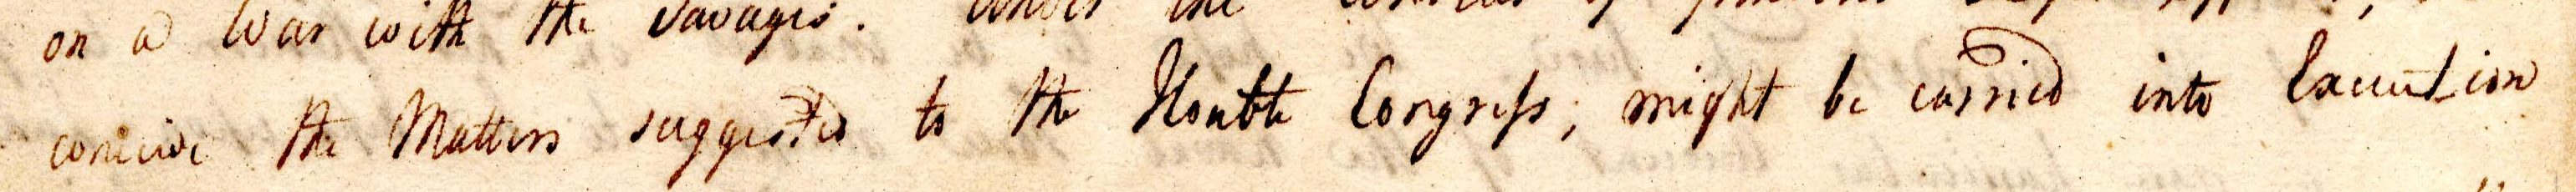conceive the Matters suggested to the Honble Congress might be carried into Execution
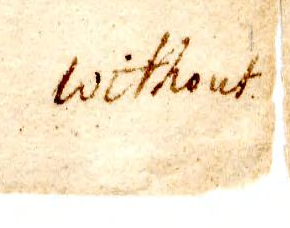without
